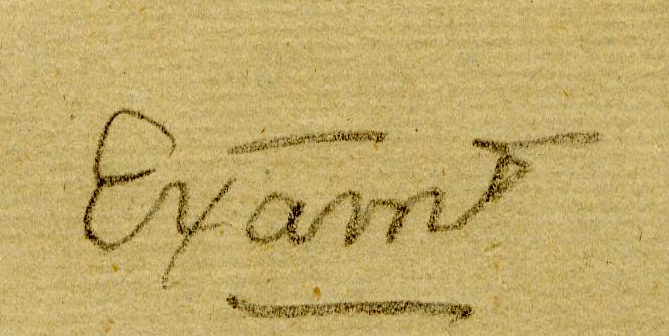Exam^d
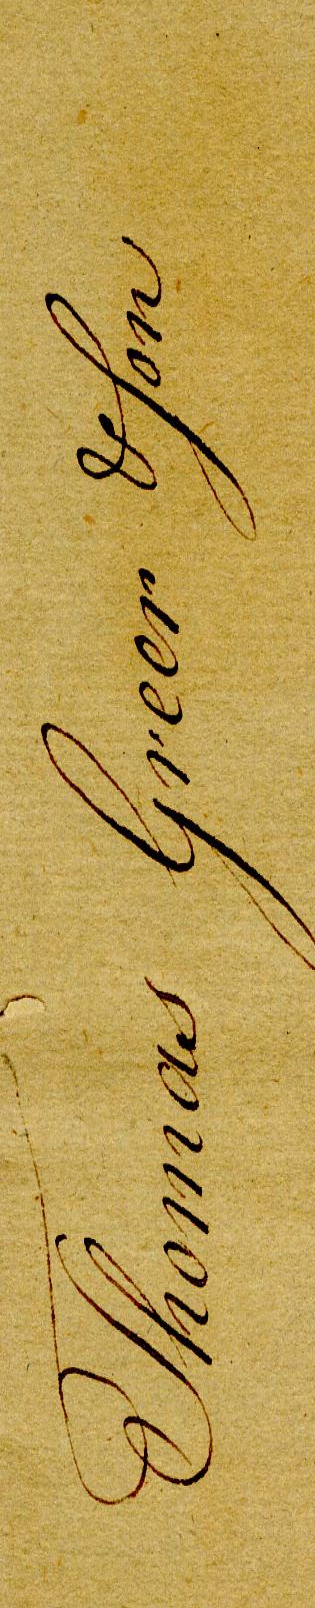Thomas Greer & son
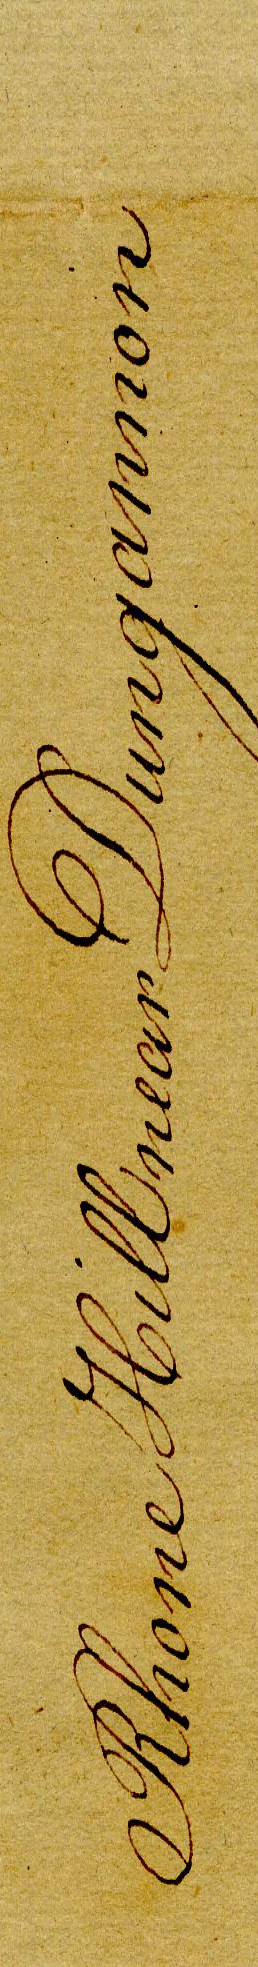Rhone Hill near Dungannon
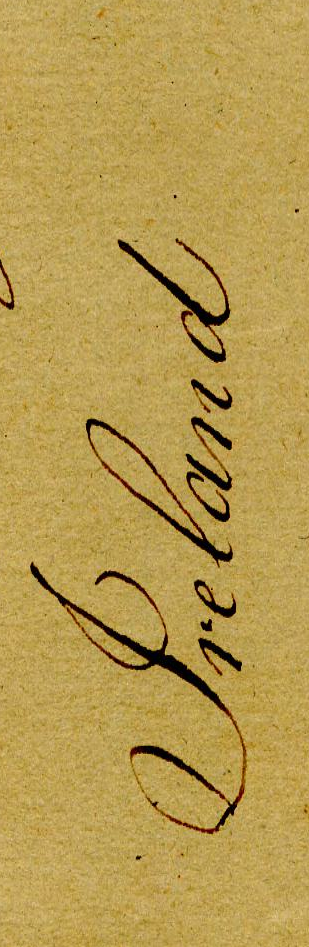Ireland
